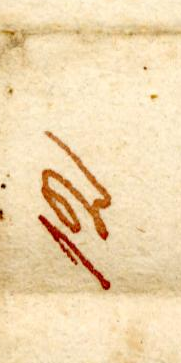12
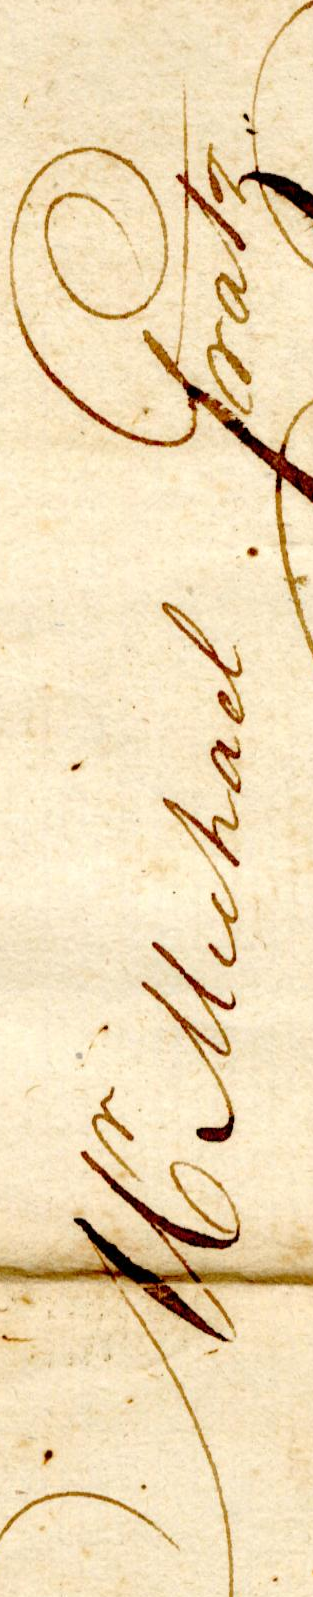M^r Michael Gratz
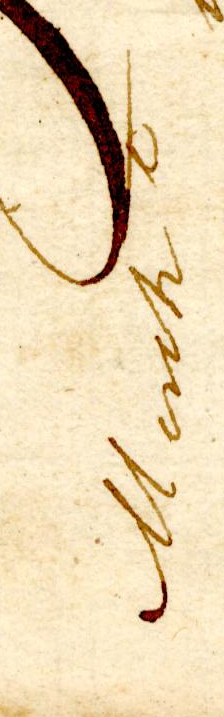Merch^t
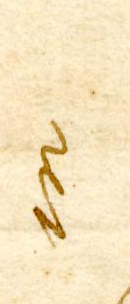in
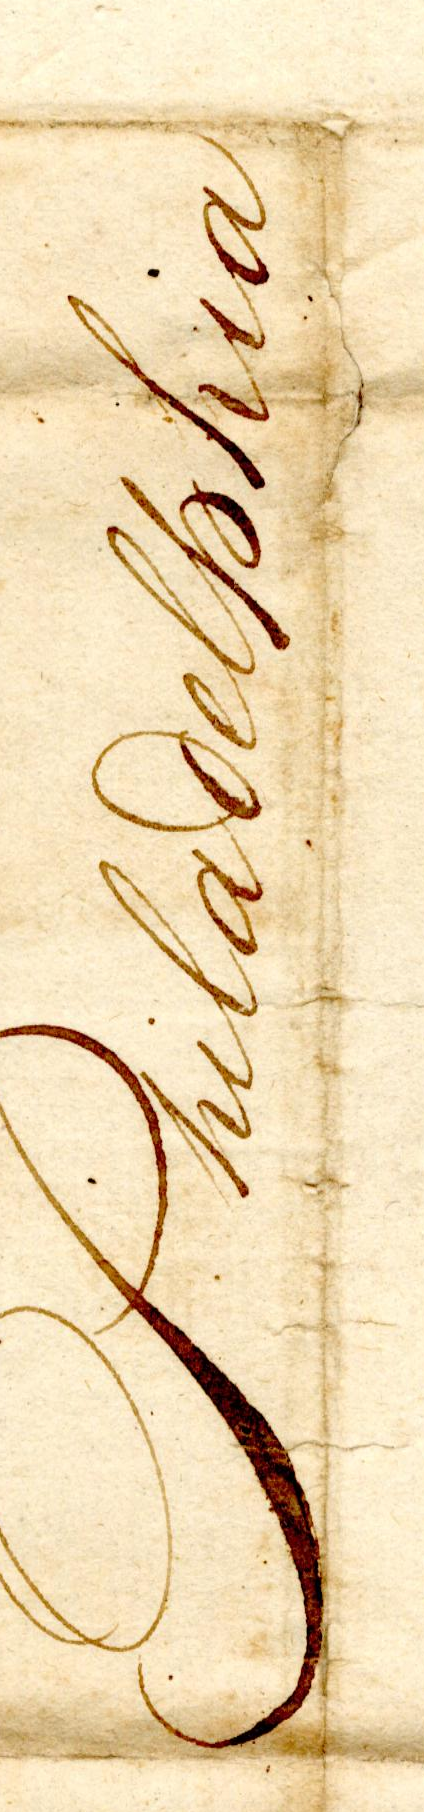Philadelphia
